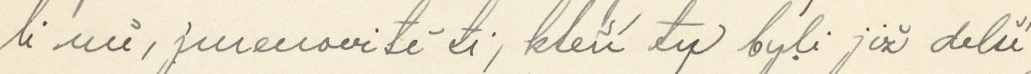li mě, jmenovitě ti, kteří tu byli již delší
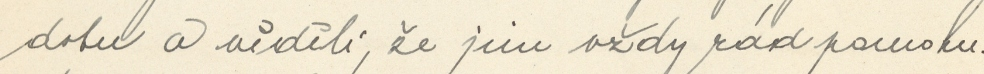dobu a věděli, že jim vždy rád pomohu.
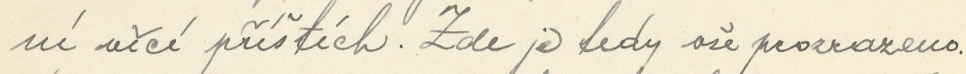ní věcí příštích. Zde je tedy vše prozrazeno.
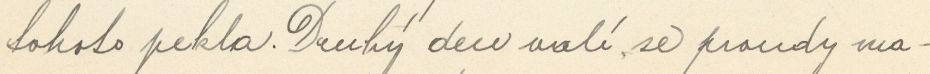tohoto pekla. Druhý den valí se proudy ma-
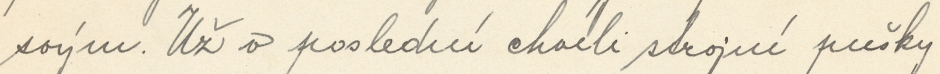svým. Už v poslední chvíli strojní pušky
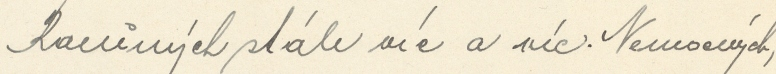Raněných stále víc a víc. Nemocných,
